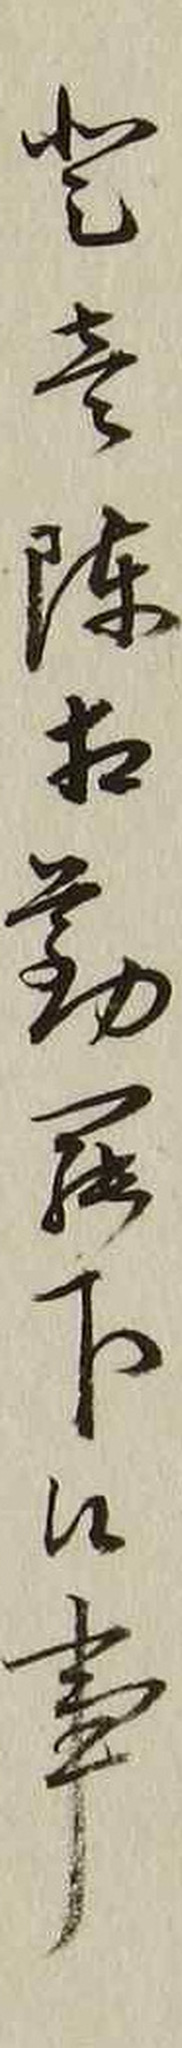登壱陣相勤罷下候事
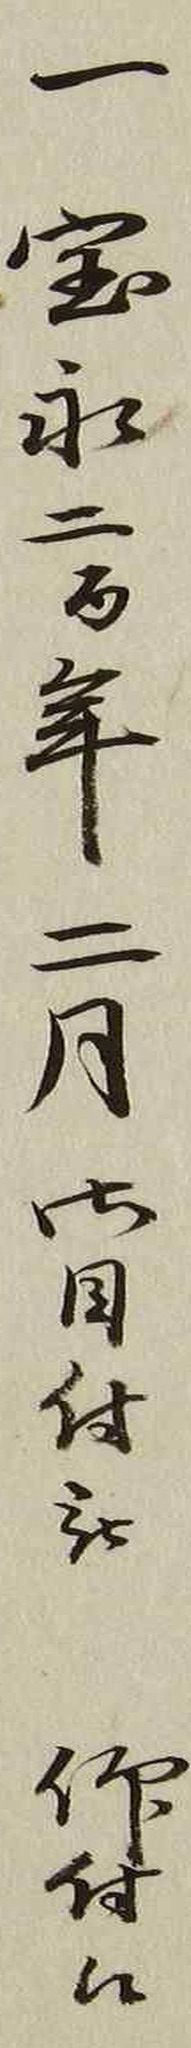一宝永二酉年二月御目付被仰付候
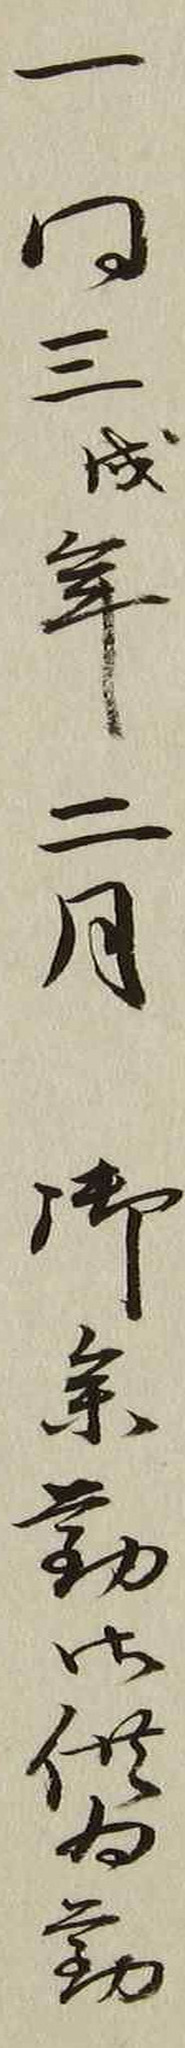一同三戌年二月御参勤御供為勤
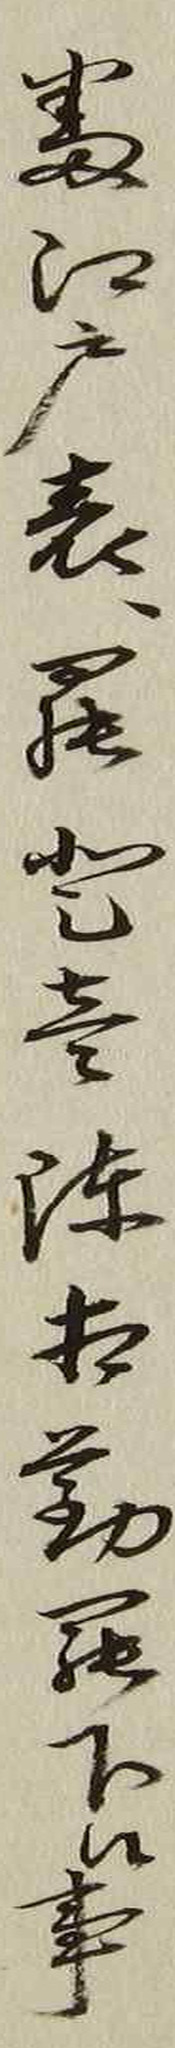番江戸表へ罷登壱陣相勤罷下候事
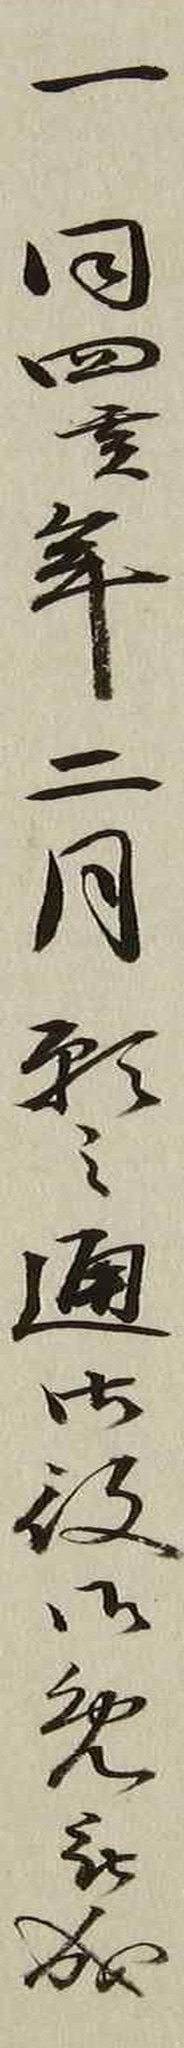一同四亥年二月願之通御役御免被成
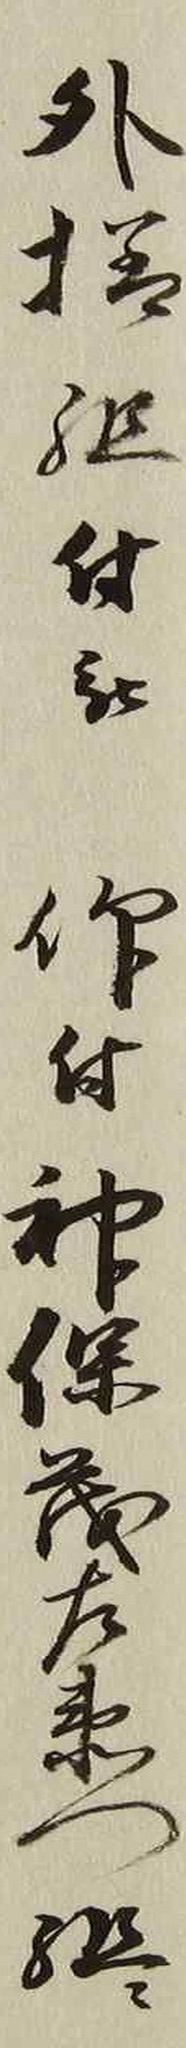外様組付被仰付神保茂左衛門組ニ
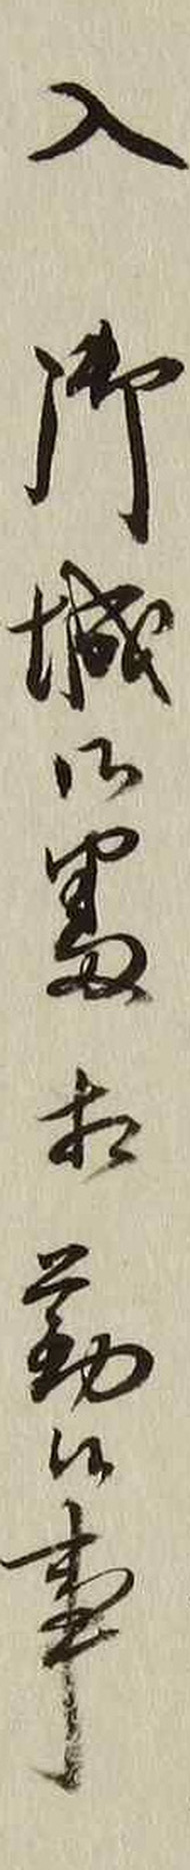入御城御番相勤候事
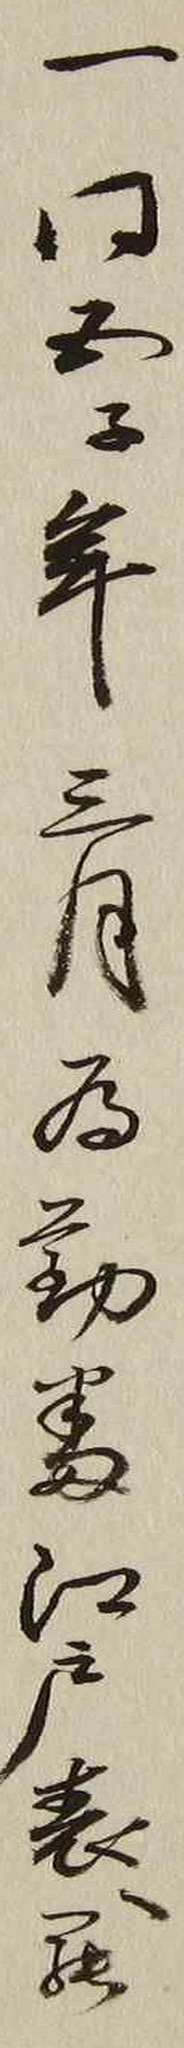一同五子年三月為勤番江戸表へ罷
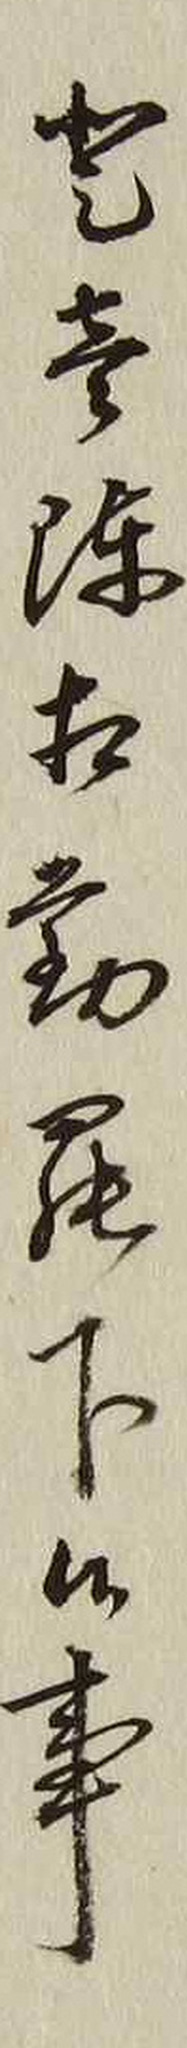登壱陣相勤罷下候事
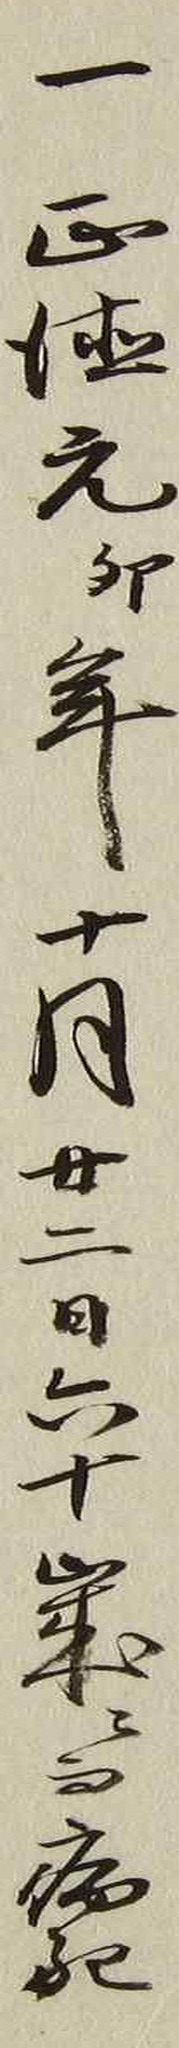一正徳元卯年十月廿二日六十歳ニ而病死
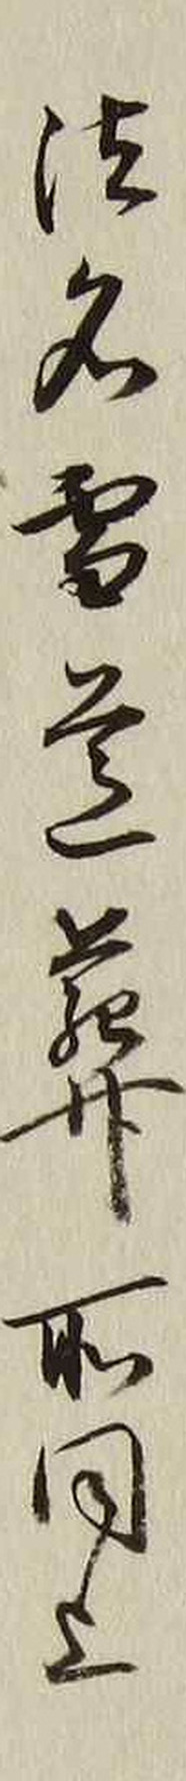法名雪道葬所同上
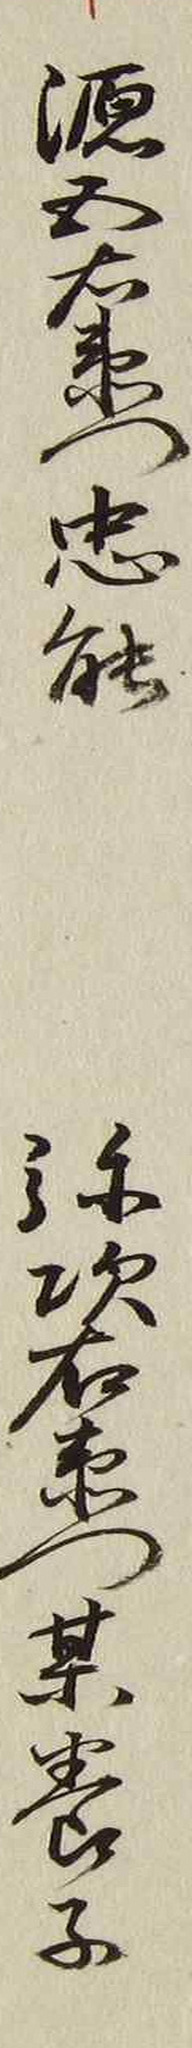源五右衛門忠能彌次右衛門某養子
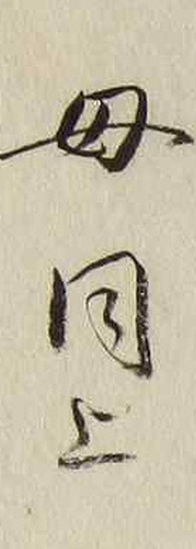母同上

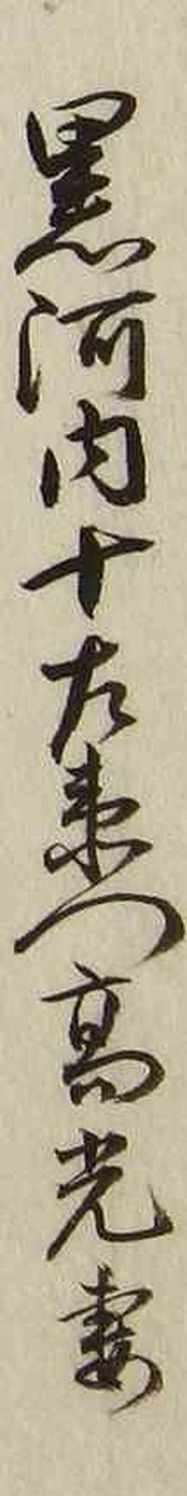女黒河内十左衛門高光妻
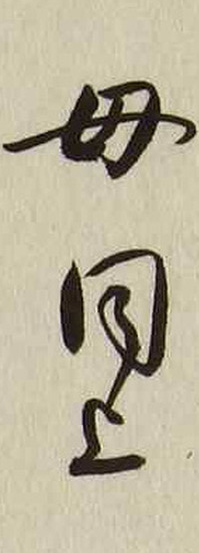母同上
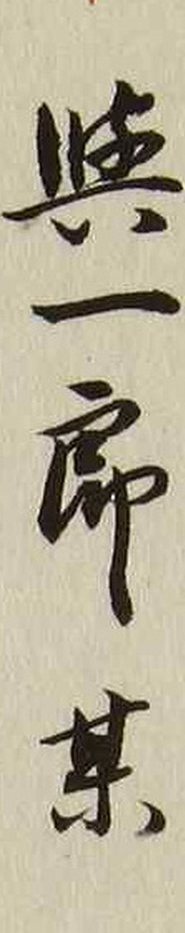與一郎某
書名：諸士系譜　巻之160　な之部2
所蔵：会津若松市立会津図書館
